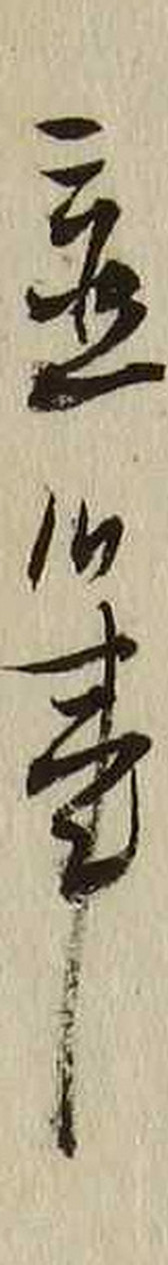置候事
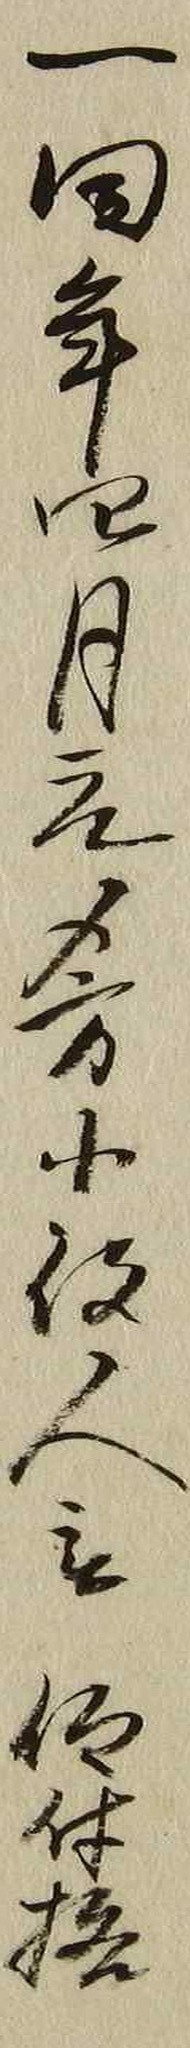一同年四月元〆方小役人被仰付格
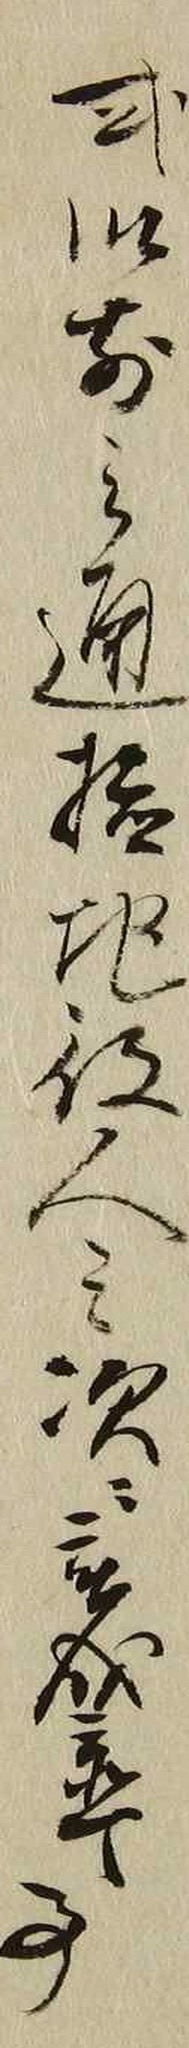式以前之通検地役人之次被成置候事
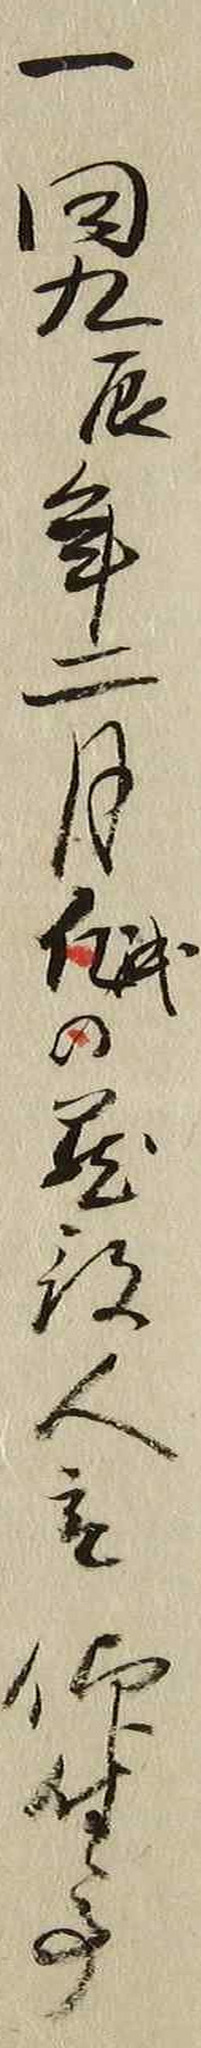一同九辰年二月紙蔵役人被仰付候事
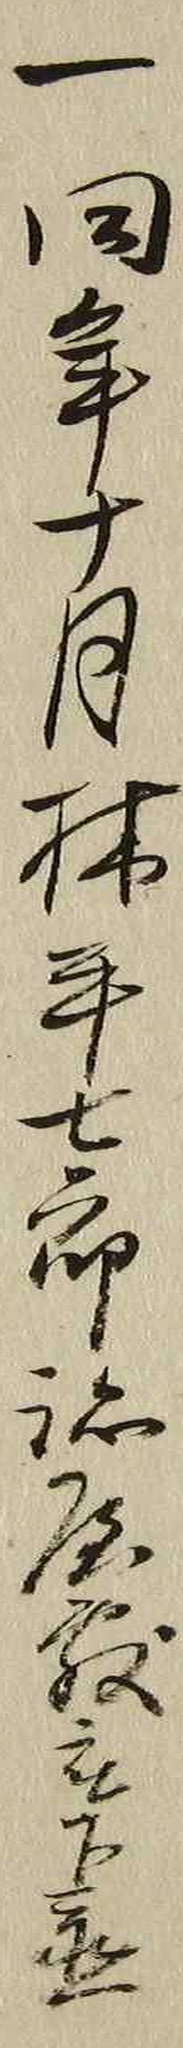一同年十月林平七郎跡屋敷被下置
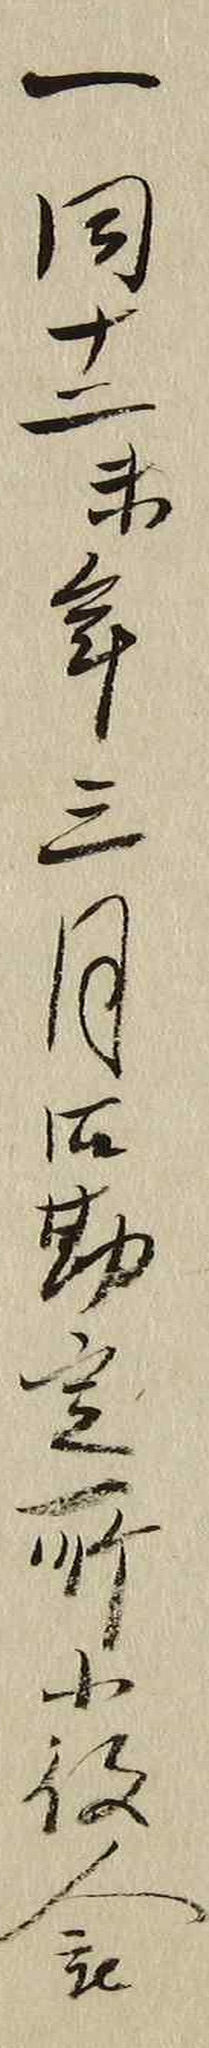一同十二未年三月御勘定所小役人被
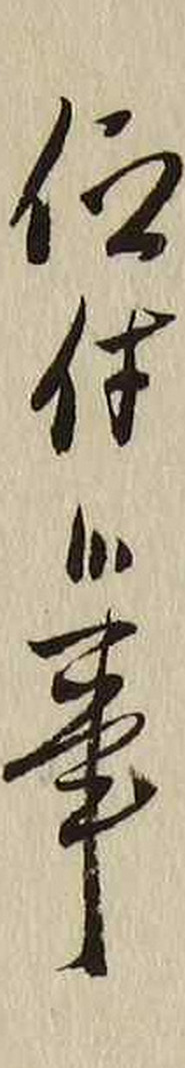仰付候事
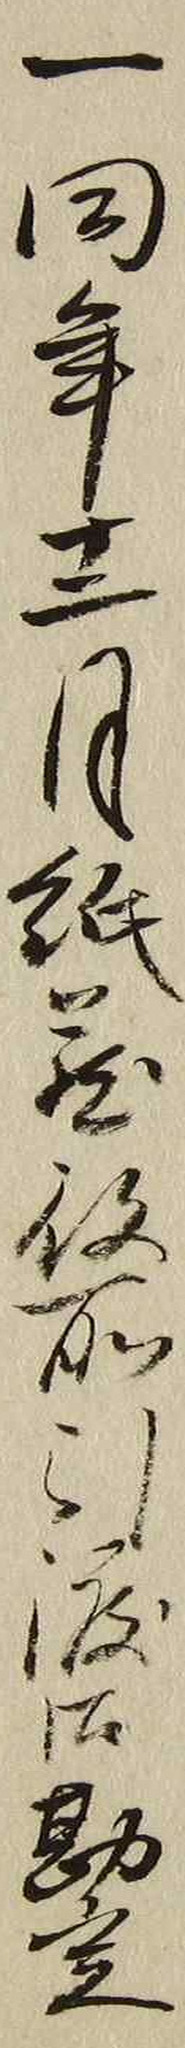一同年十二月紙蔵役所引渡御勘定
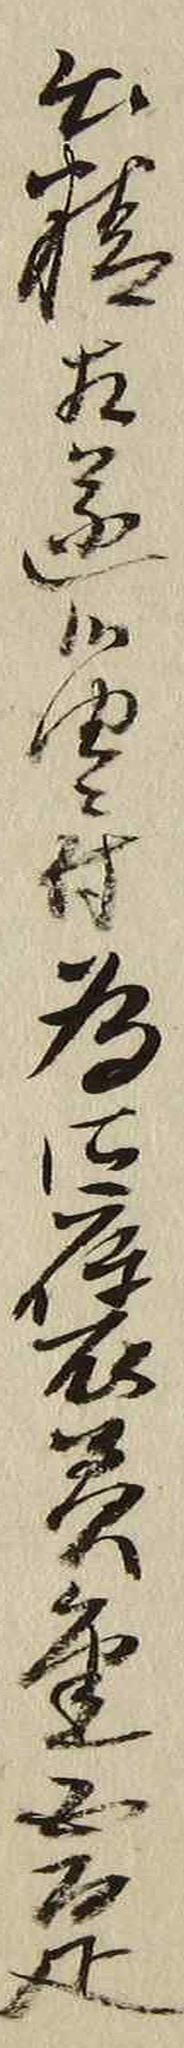出精相遂候由付為御褒美金五百疋
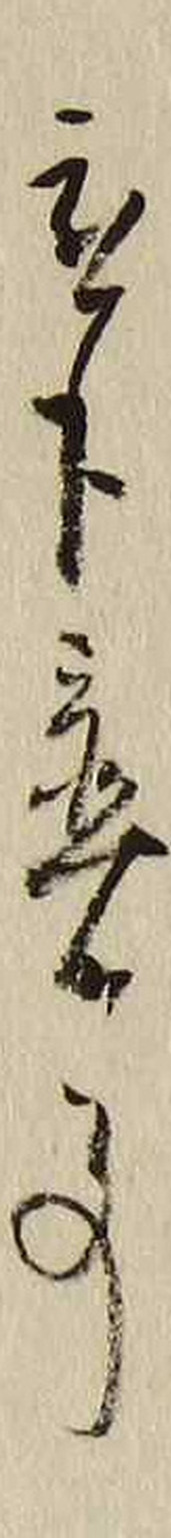被下置候事
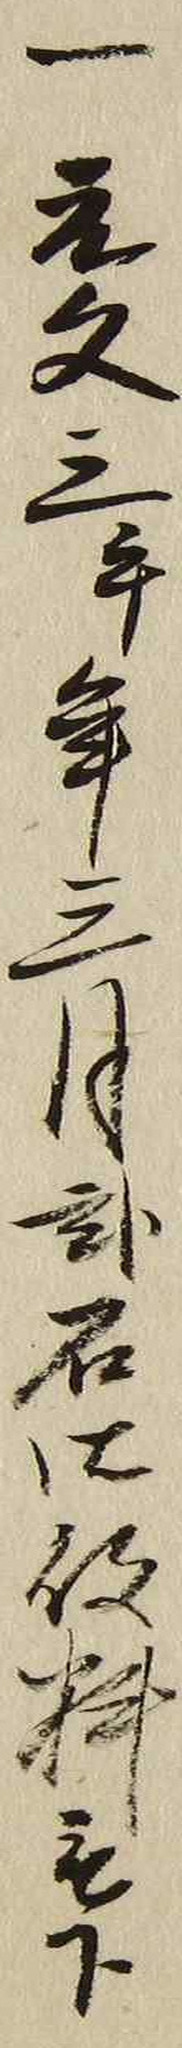一元文三午年三月弐石御役料被下
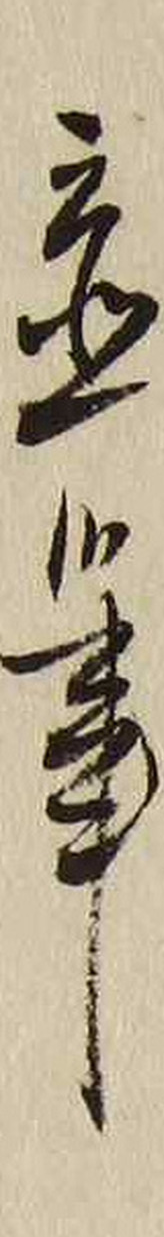置候事

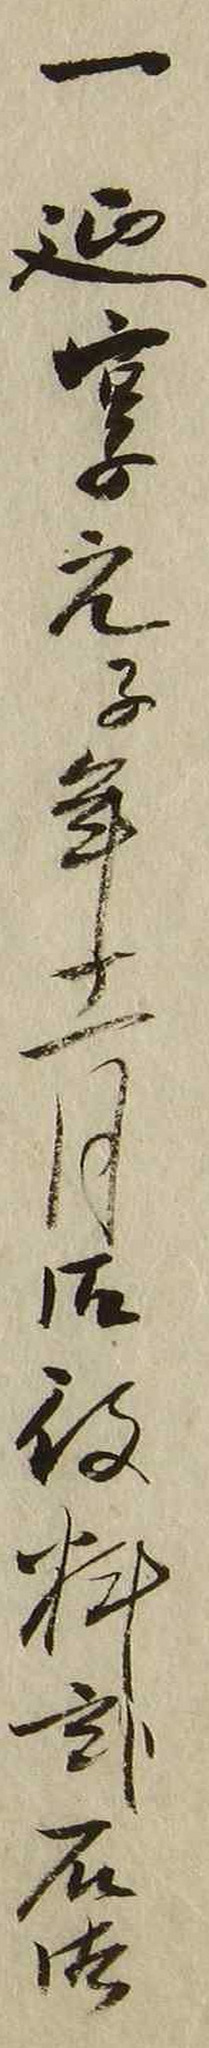一延享元子年十一月御役料弐石御
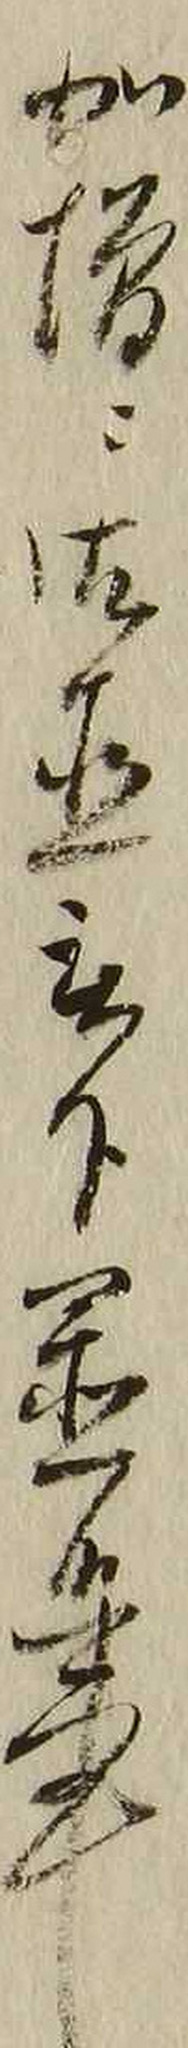加増御直被下置候事
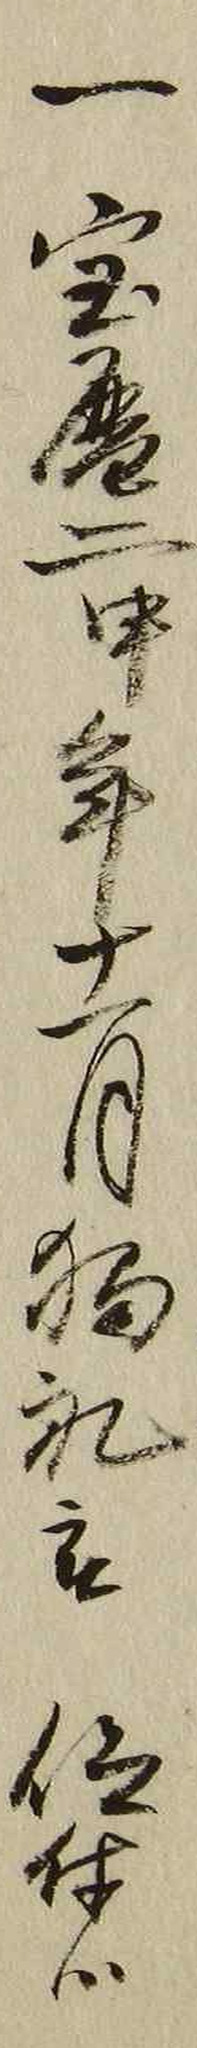一宝暦二申年十一月独礼被仰付候
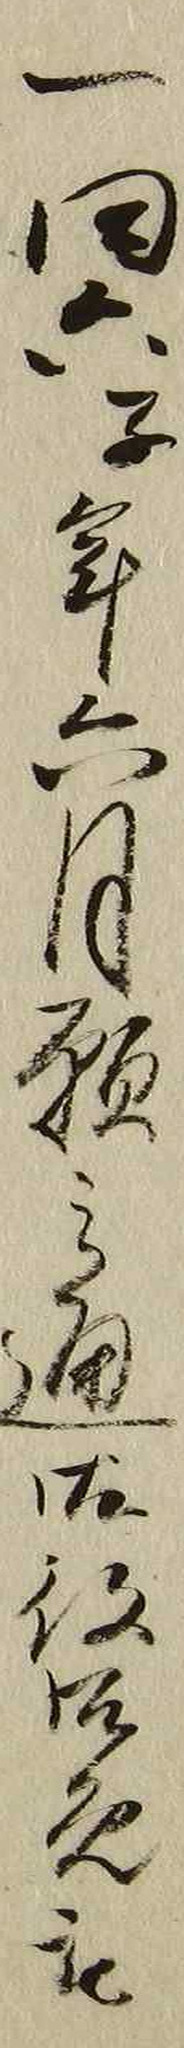一同六子年六月願之通御役御免被
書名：諸士系譜　巻之350　せ之部1冊全
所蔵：会津若松市立会津図書館
